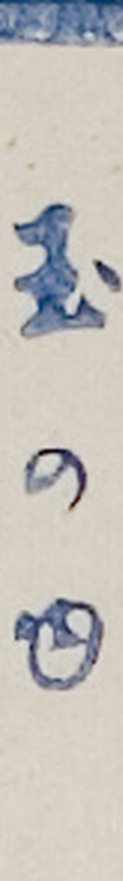玉のゆ
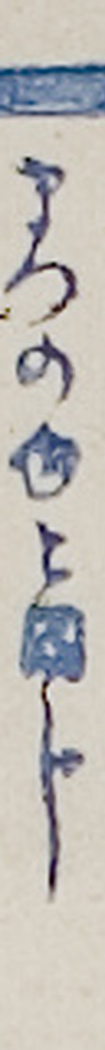まつのゆと同じ
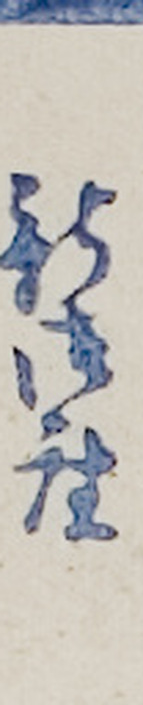新御座
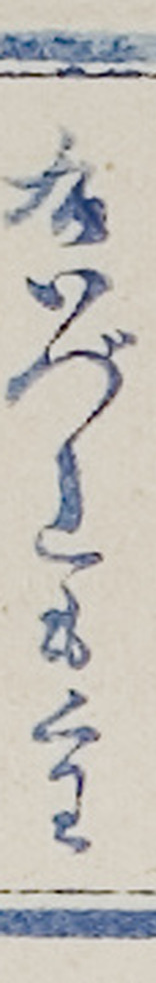右いづれもくわ
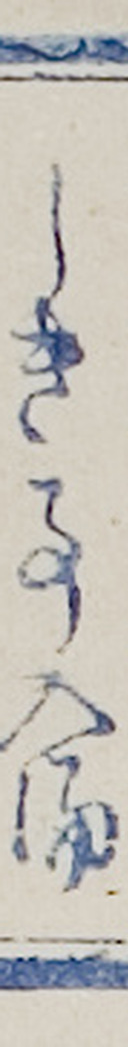しき事入湯
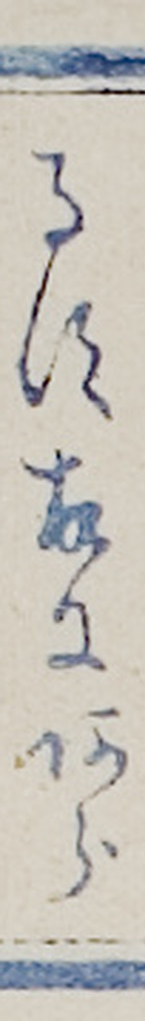るす右にあら
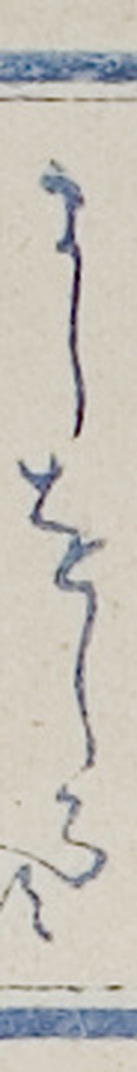ましをしるす
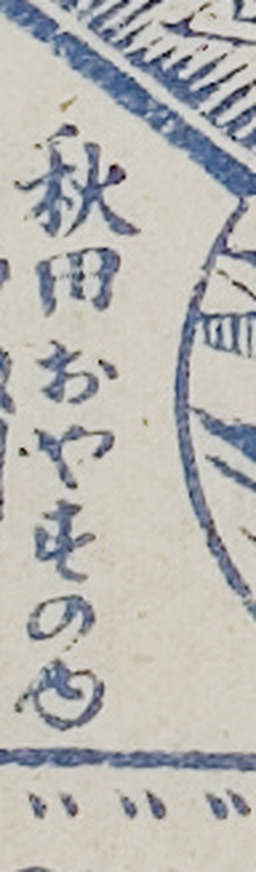秋田おやすのゆ
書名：諸国温泉鑑 上州草津温泉図
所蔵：東京大学総合図書館 General Library in the University of Tokyo, JAPAN
